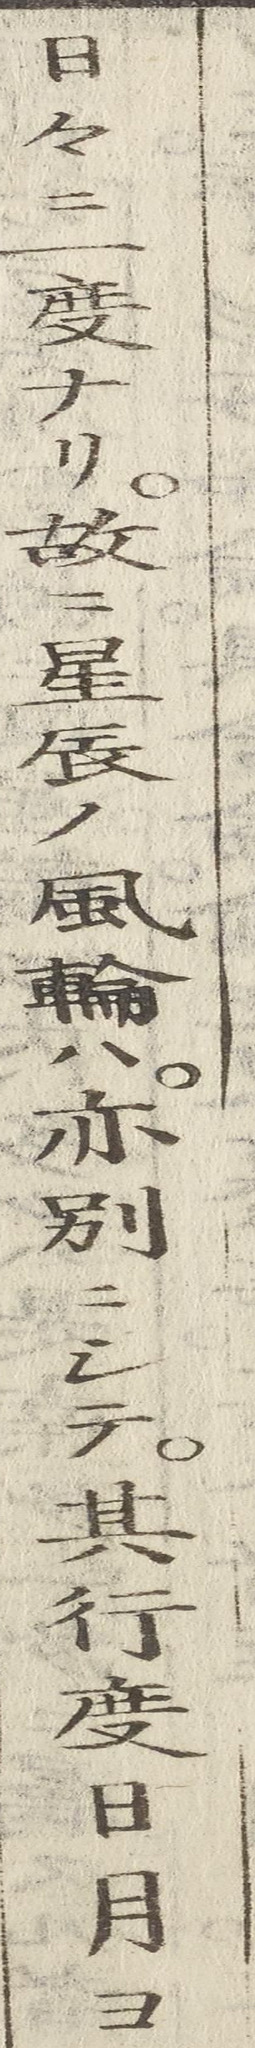日々ニ一度ナリ。故ニ星辰ノ風輪ハ。亦別ニシテ。其行度日月ヨ
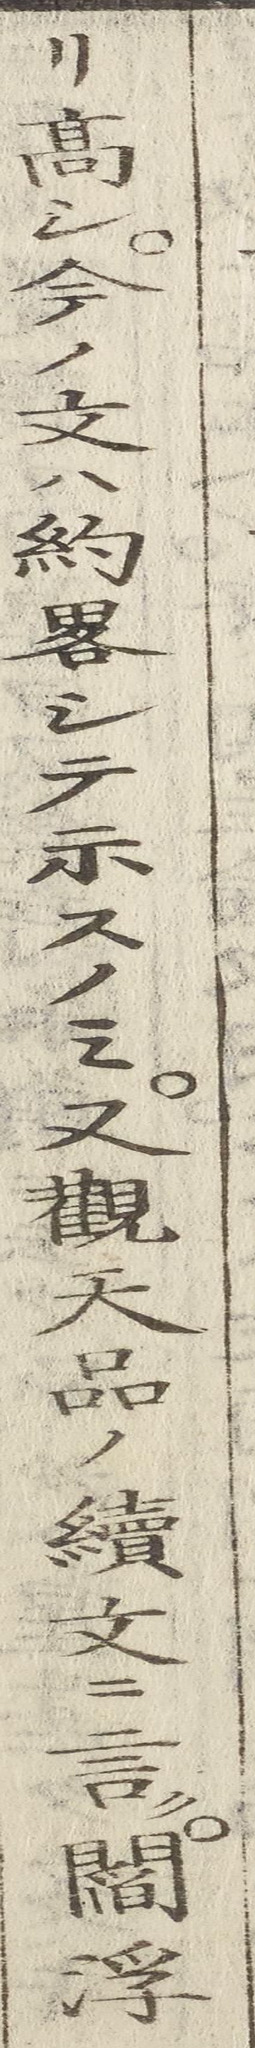リ髙シ。今ノ文ハ約略シテ示スノミ。又観天品ノ続文ニ言。閻浮

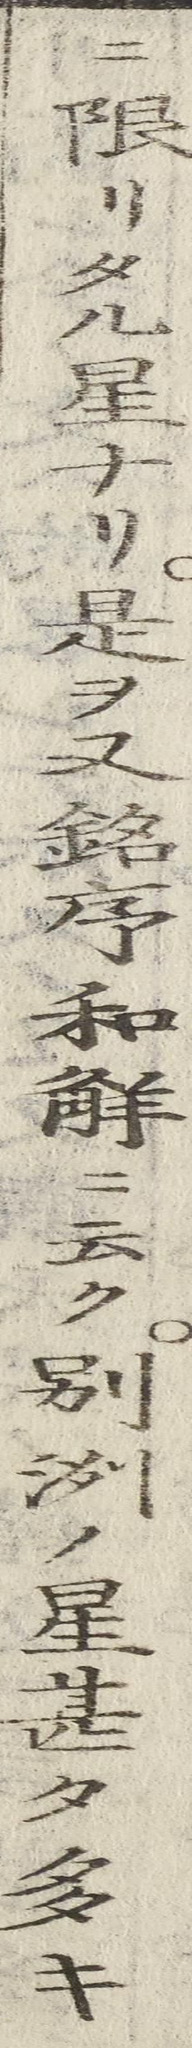ニ限リタル星ナリ。是ヲ又銘序和解ニ云ク。別洌ノ星甚タ多キ
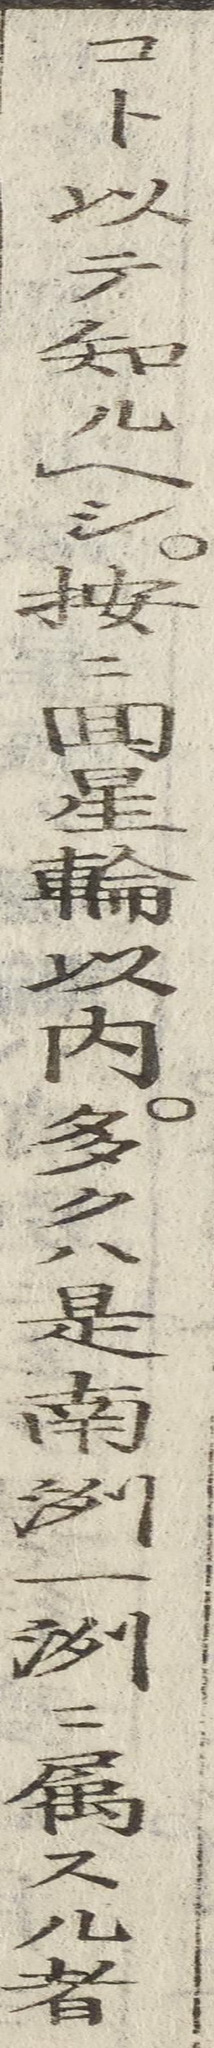コト以テ知ルヘシ。按ニ回星輪以内。多クハ是南洌一洌ニ属スル者
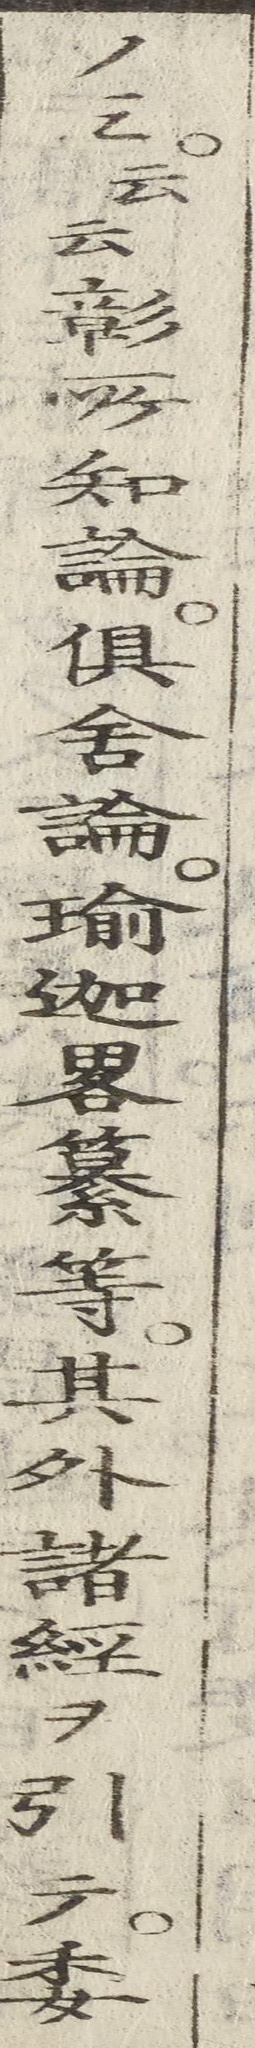ノミ。云云彰所知論。倶舎論。瑜迦略纂等。其外諸経ヲ引テ。委
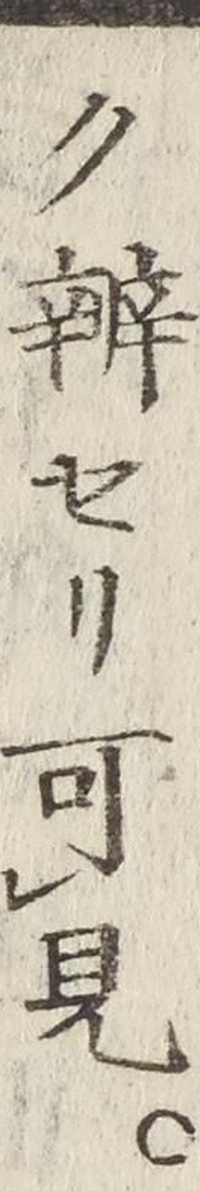ク弁セリ可見。
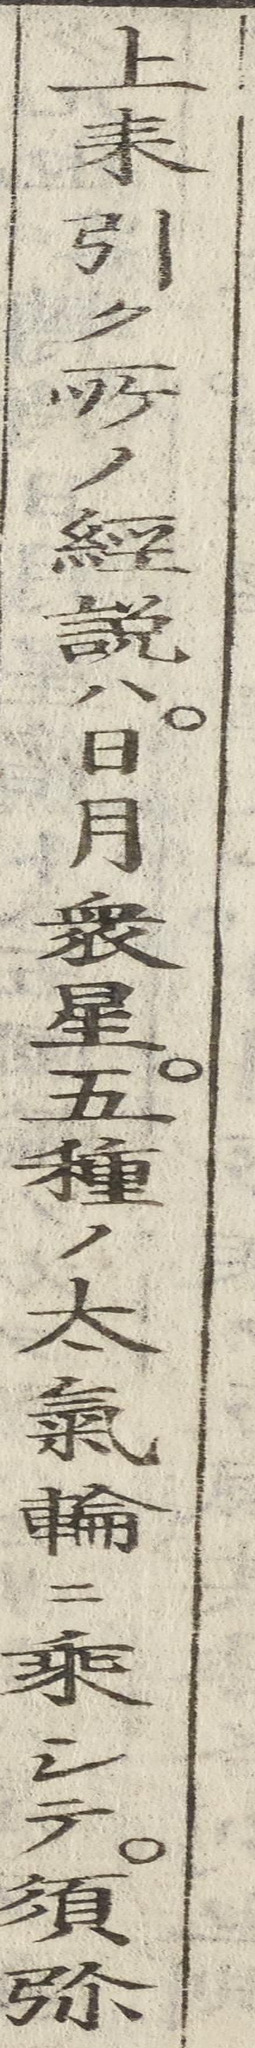上来引ク所ノ経説ハ。日月衆星。五種ノ太気輪ニ乗シテ。須弥
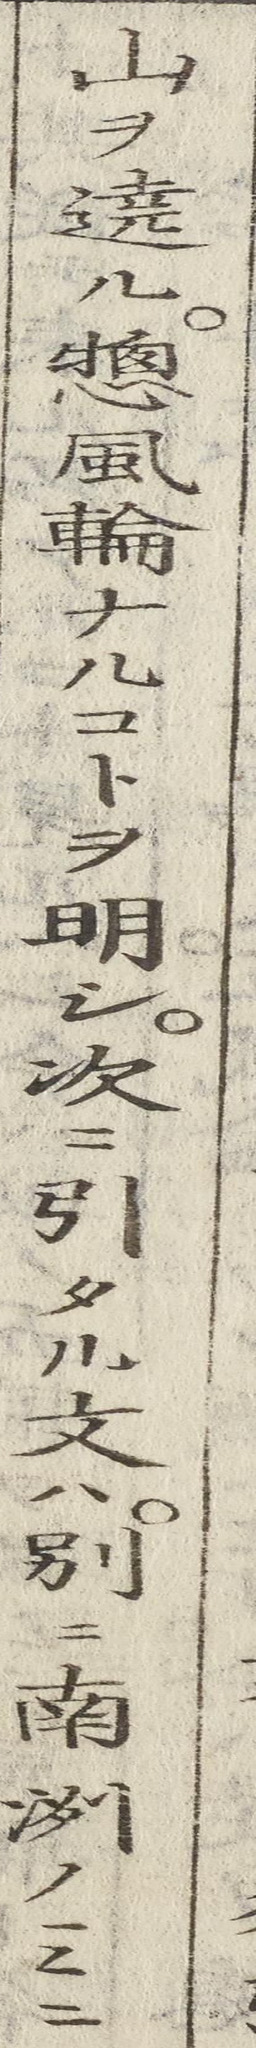山ヲ遶ル。惣風輪ナルコトヲ明シ。次ニ引タル文ハ。別ニ南洌ノミニ
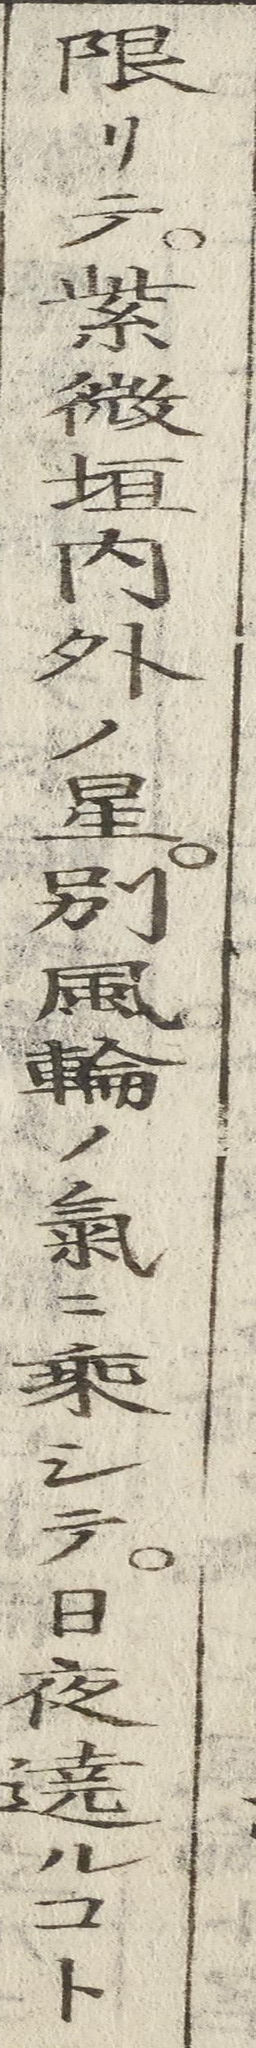限リテ。紫微垣内外ノ星。別風輪ノ気ニ乗シテ。日夜遶ルコト
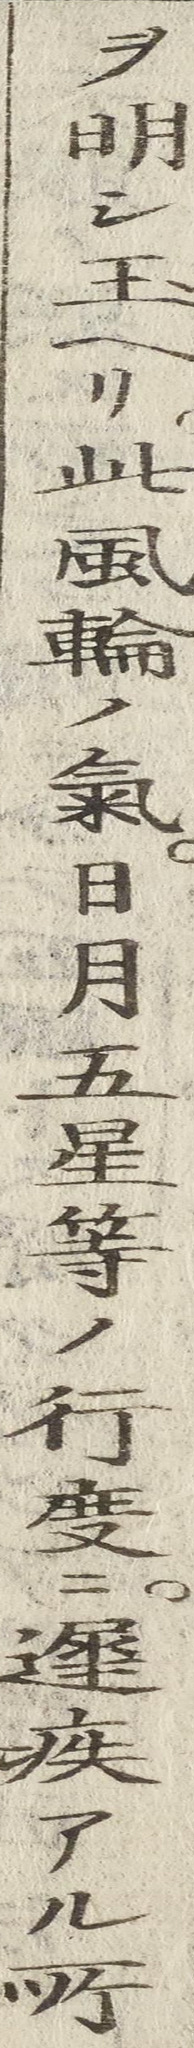ヲ明シ玉ヘリ。此風輪ノ気。日月五星等ノ行度ニ。遅疾アル所
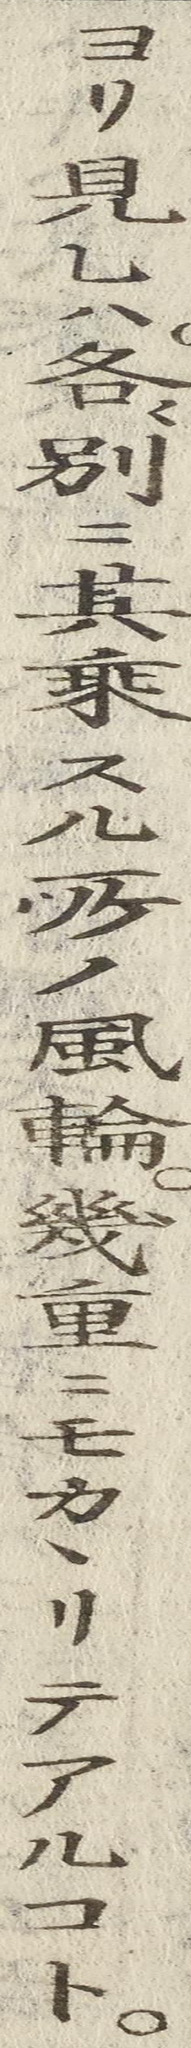ヨリ見レハ。各〳〵別ニ其乗スル所ノ風輪。幾重ニモカヽリテアルコト。
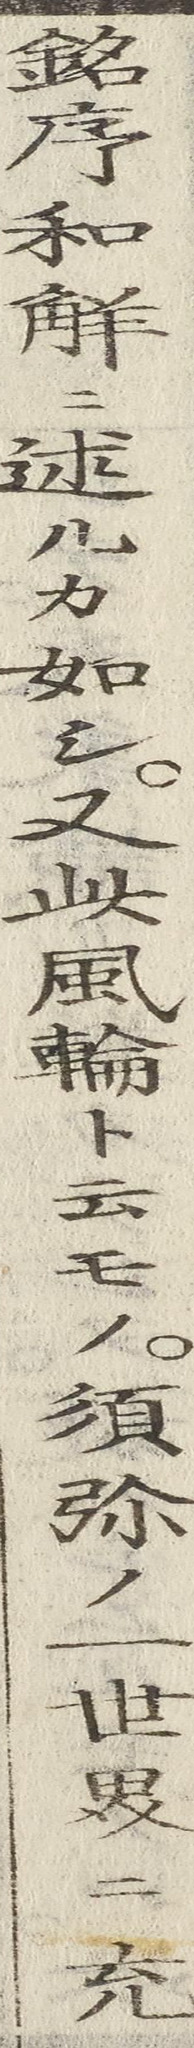銘序和解ニ述ルカ如シ。又此風輪ト云モノ。須弥ノ一世界ニ充
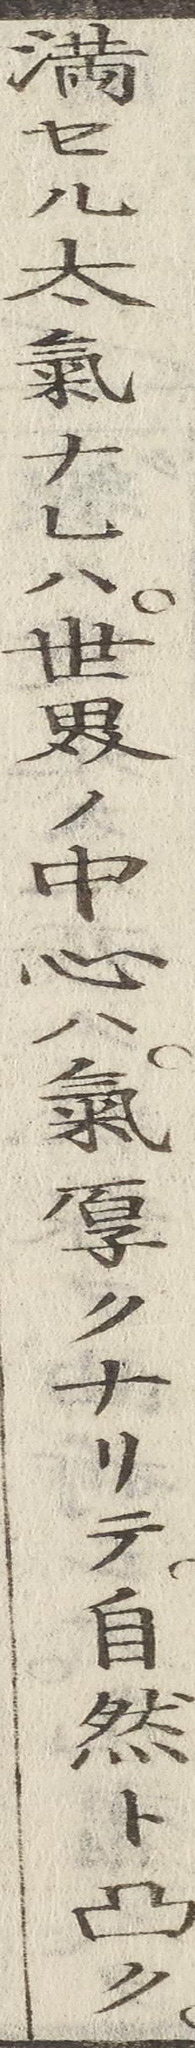満セル太気ナレハ。世界ノ中心ハ。気厚クナリテ。自然ト凸ク。
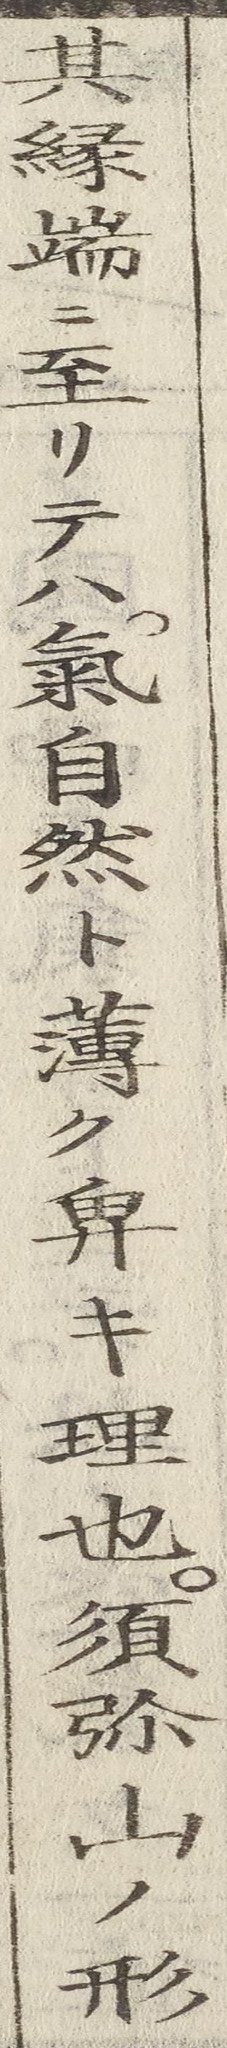其縁端ニ至リテハ。気自然ト薄ク卑キ理也。須弥山ノ形
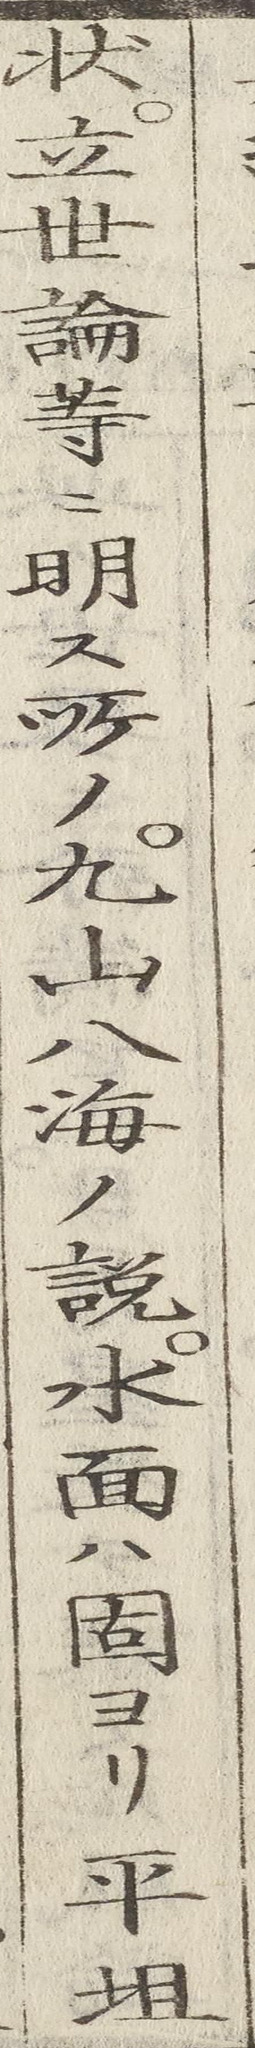状。立世論等ニ明ス所ノ。九山八海ノ説。水面ハ固ヨリ平坦
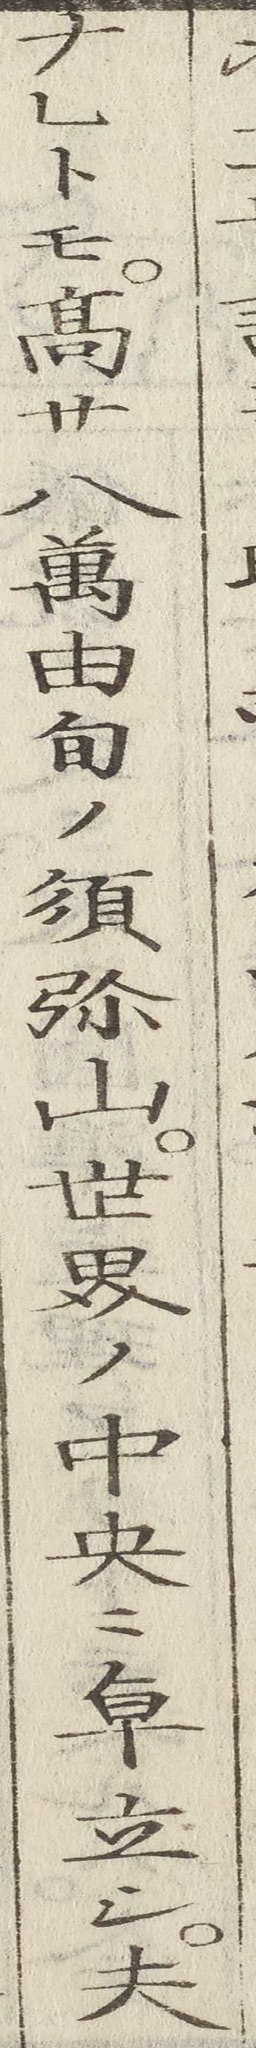ナレトモ。高サ八万由旬ノ須弥山。世界ノ中央ニ卓立シ。夫
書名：護法新論　上
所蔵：東京大学地震研究所図書室 Earthquake Research Institute Library, The University of Tokyo, JAPAN
